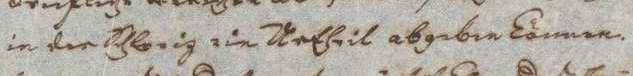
in der Schweiz ein Urtheil abgeben können.
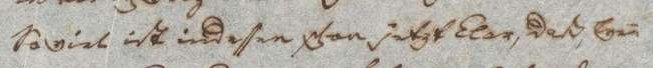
So viel ist indessen schon jetzt klar, daß, wenn
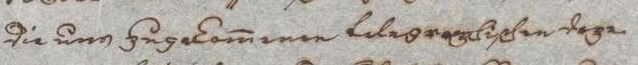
die uns zugekommenen telegraphischen Depe-
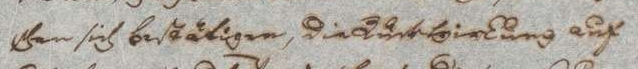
schen sich bestätigen, die Rückwirkung auf
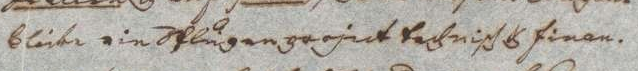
blicke ein Splügenproject technisch & finan-
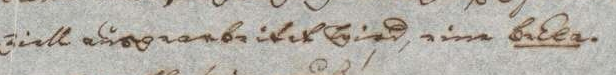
ziell ausgearbeitet wird, eine bekla-
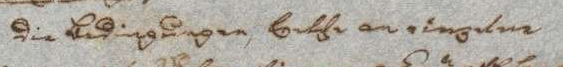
Die Bedingungen, welche an einzelne
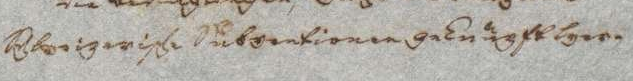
Schweizerische Subventionen geknüpft wer-
